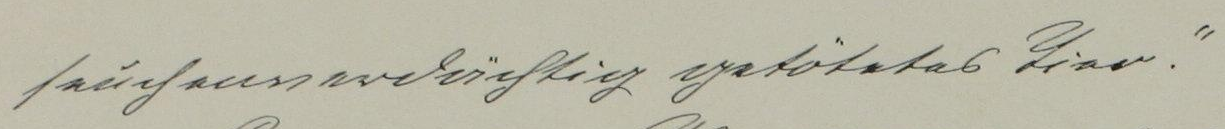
seuchenverdächtig getötetes Tier.“
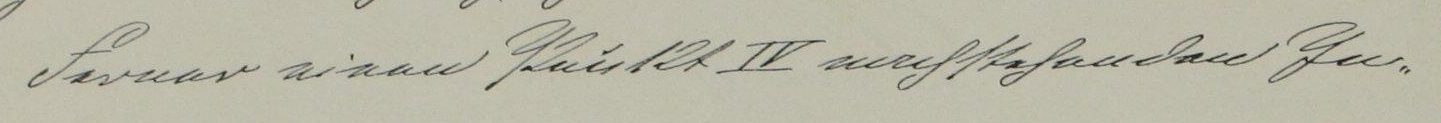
Ferner einen Punkt IV nachstehenden In-
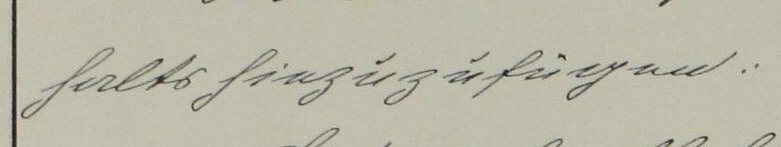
halts hinzuzufügen:
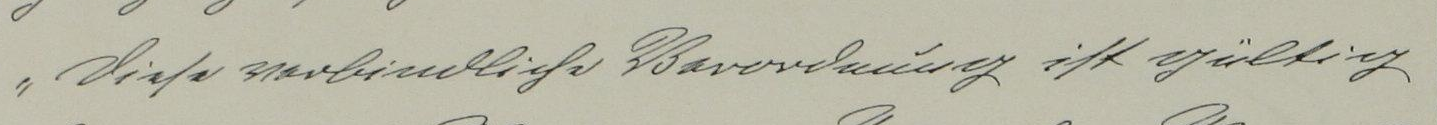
„Diese verbindliche Verordnung ist gültig
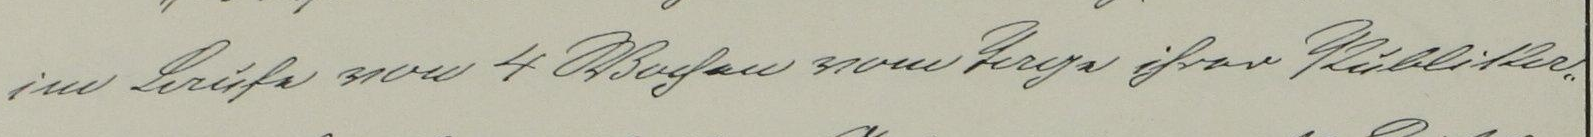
im Laufe von 4 Wochen vom Tage ihrer Publika-
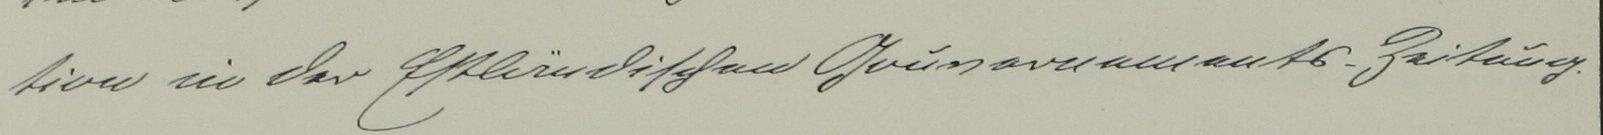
tion in der Estländischen Gouvernements-Zeitung.“
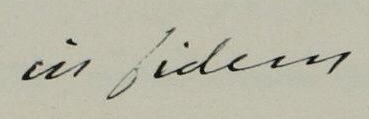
in fidem
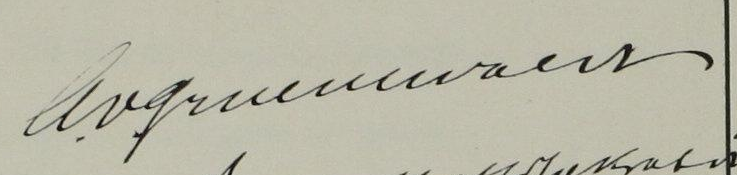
A. v. Gruenewaldt
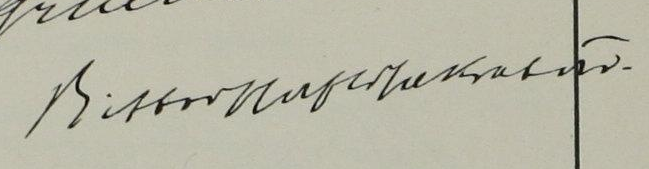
Ritterschaftssekretär
